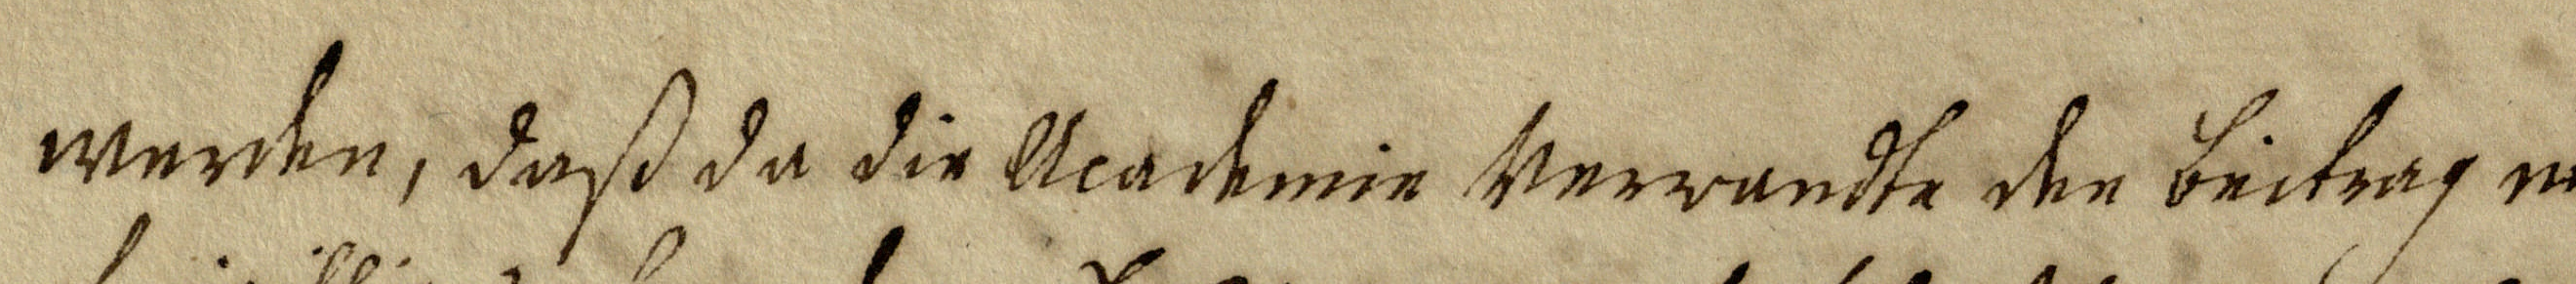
werden, daß da die Academie Verwandte den Beitrag nur
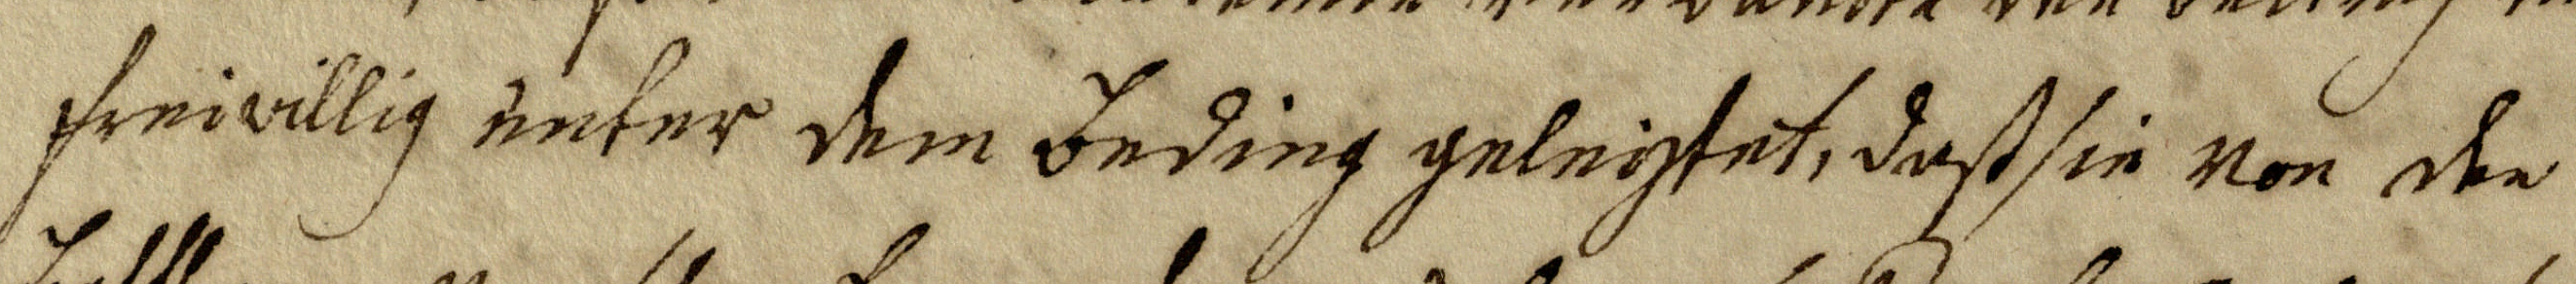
freiwillig unter dem Beding geleistet, daß sie von den
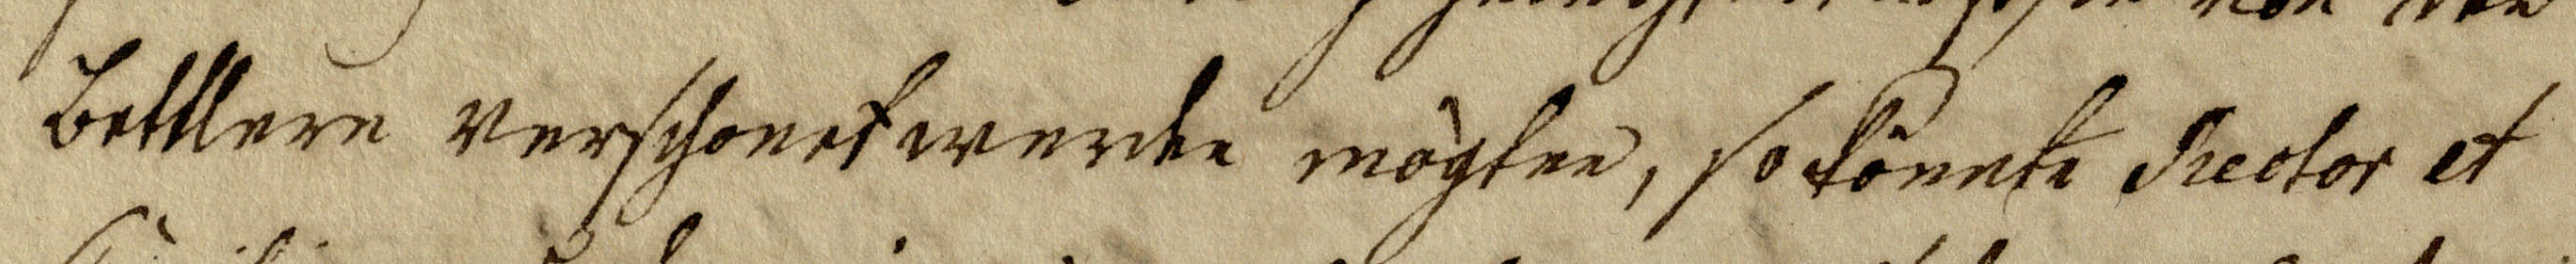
Bettlern verschont werden mögten, so könnte Rector et
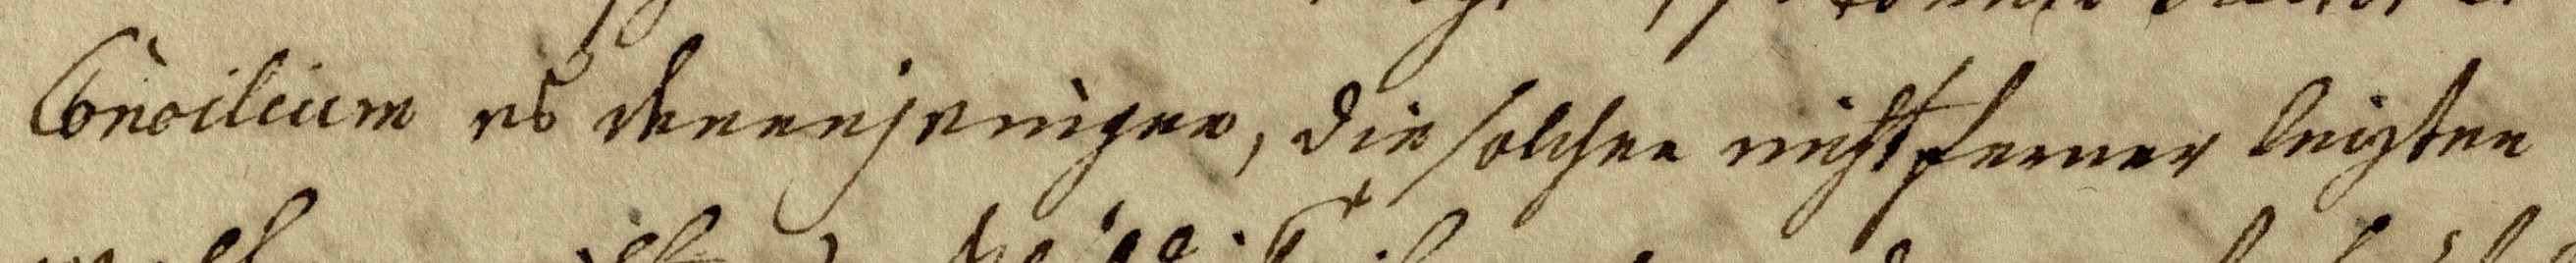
Concilium es denenjenigen, die solchen nicht ferner leisten
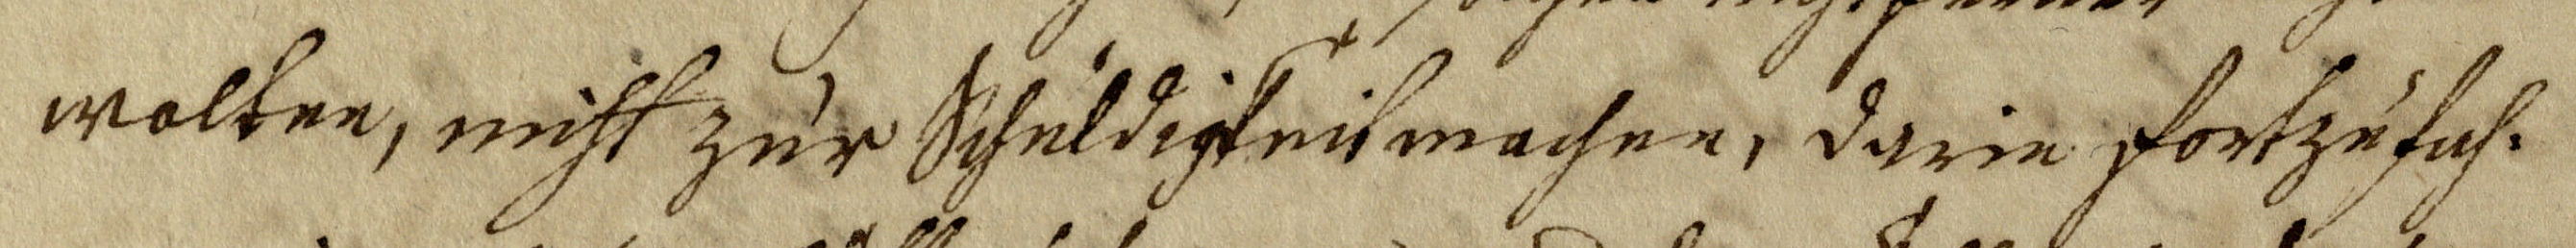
wollen, nicht zur Schuldigkeit machen, darin fortzufah¬
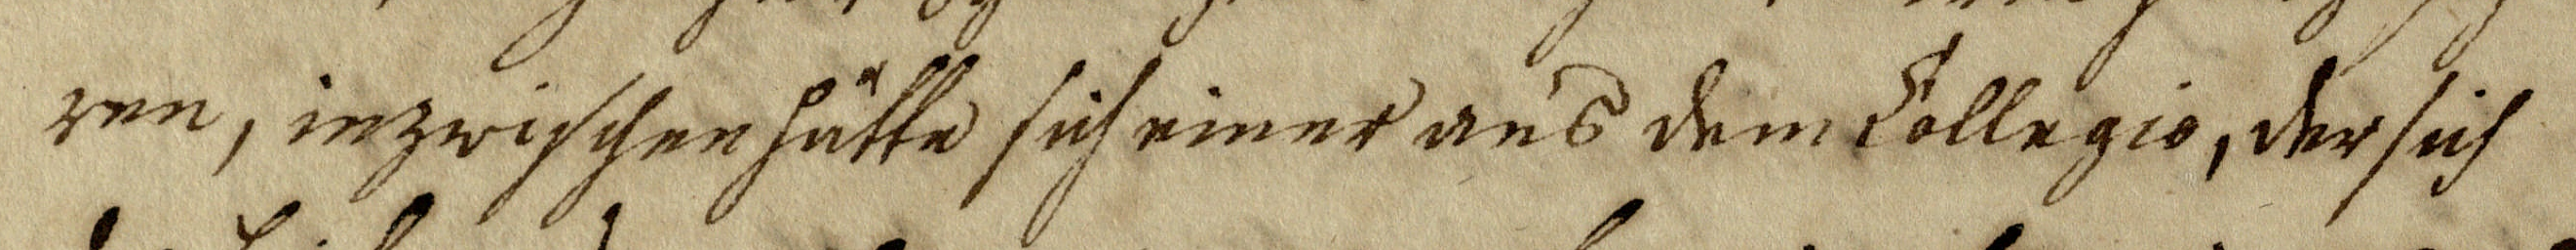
ren, inzwischen hätte sich einer aus dem Collegio, der sich
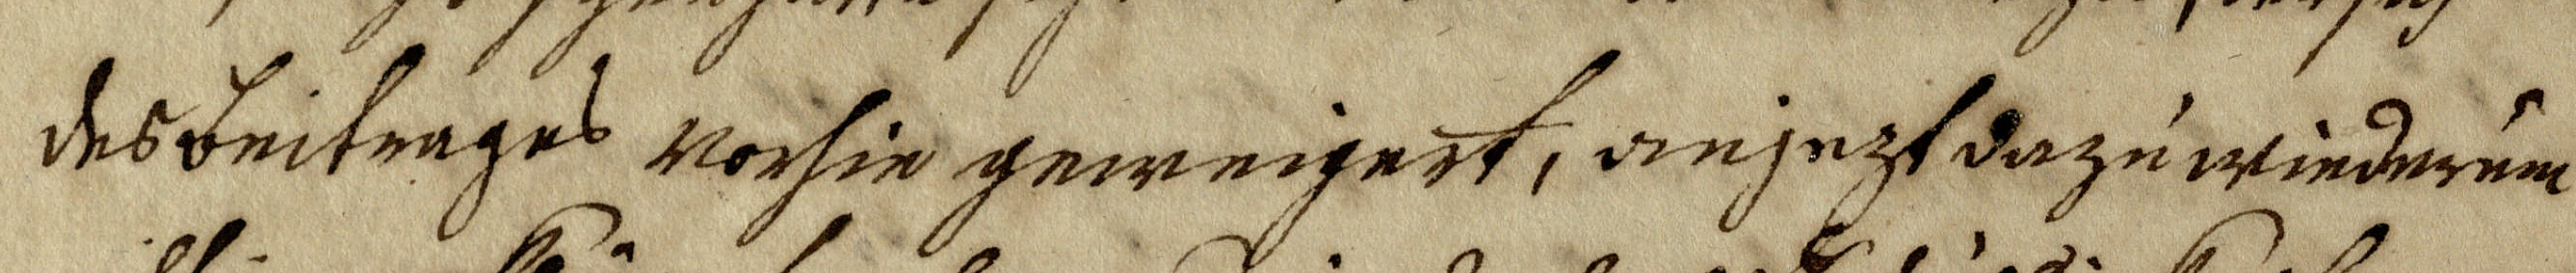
des Beitrages vorhin geweigert, anjezt dazu wiederum
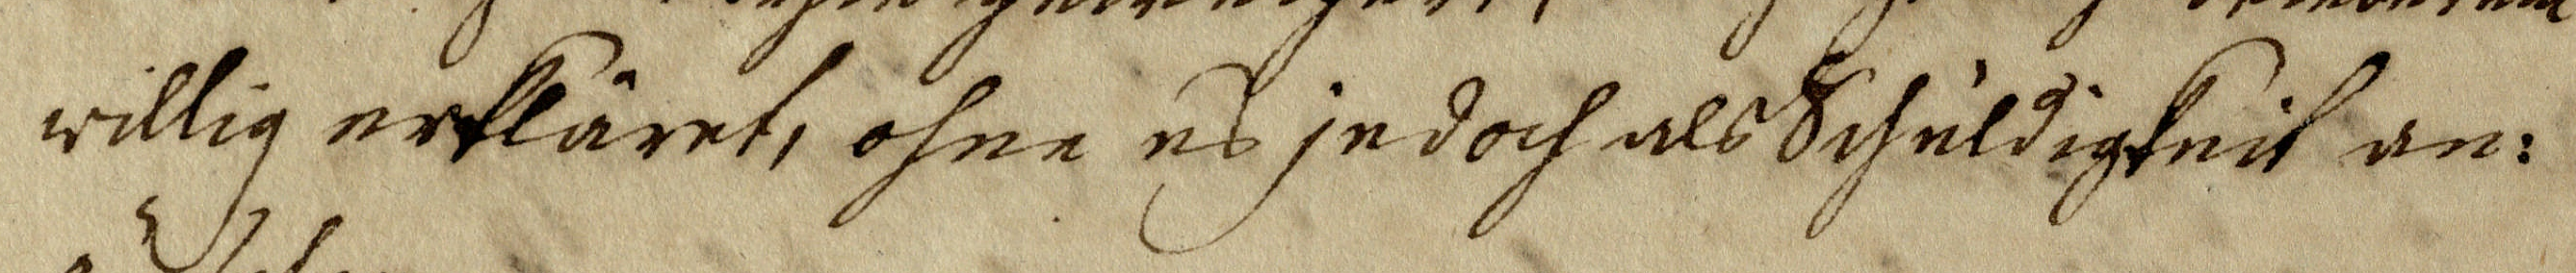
willig erkläret, ohne es jedoch als Schuldigkeit an¬
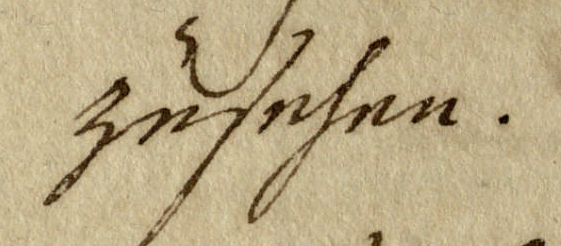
zusehen.
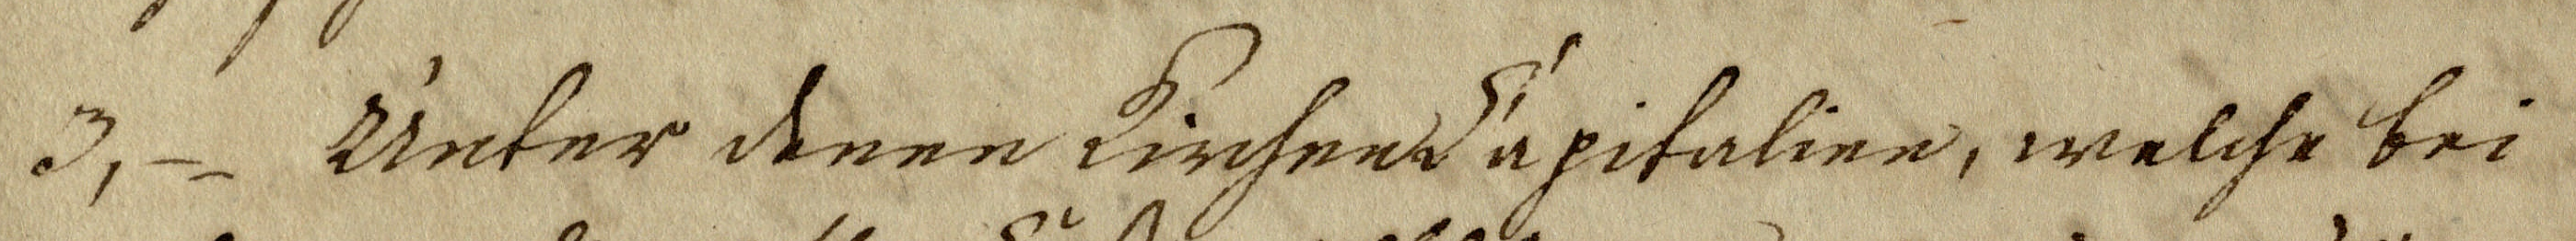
3, Unter denen Kirchen Capitalien, welche bei
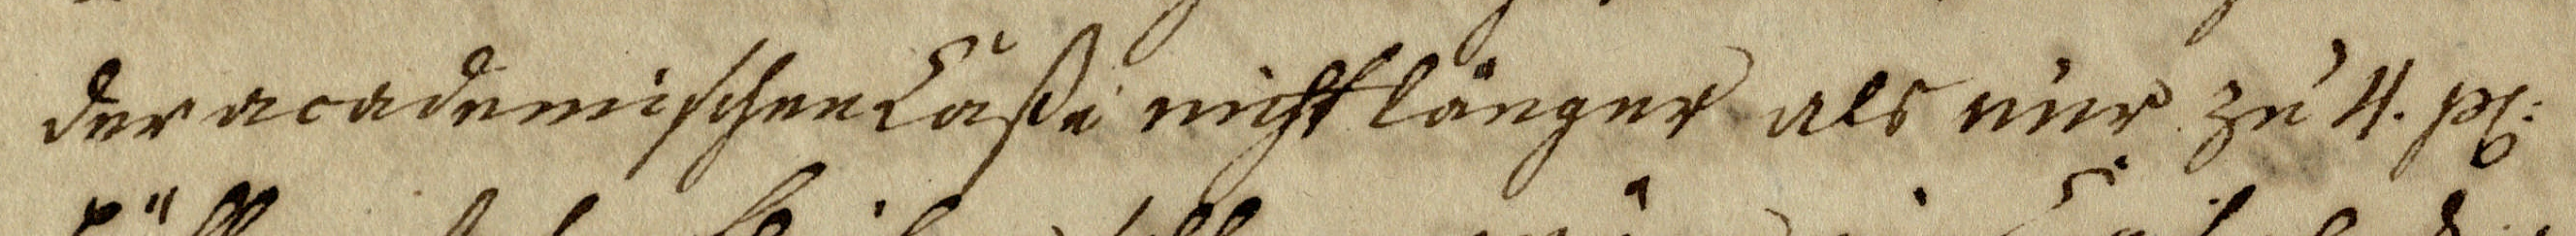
der academischen Caße nicht länger als nur zu 4. p.
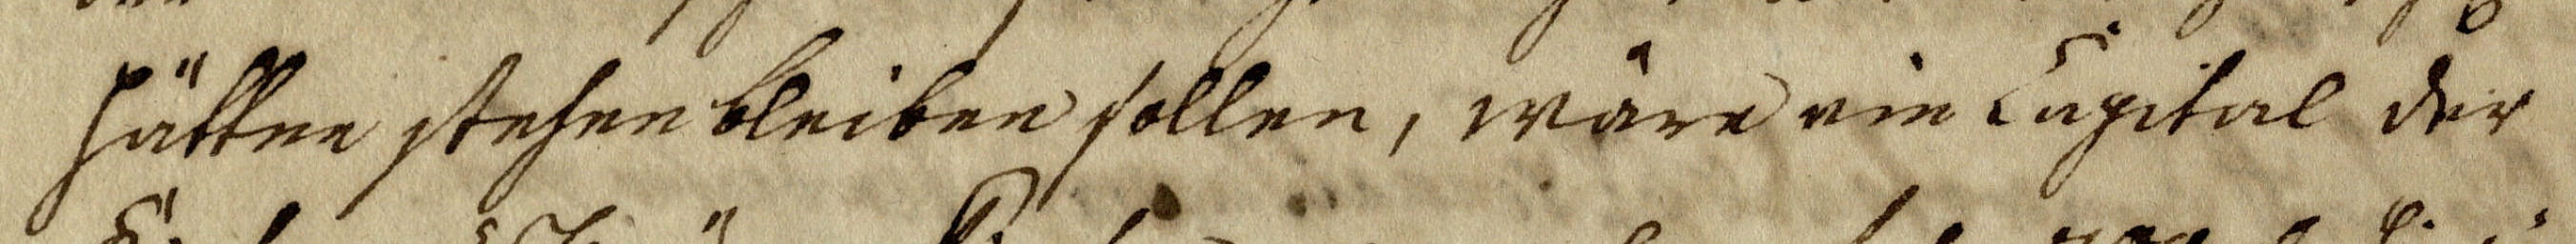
hätten stehen bleiben sollen, wäre ein Capital der
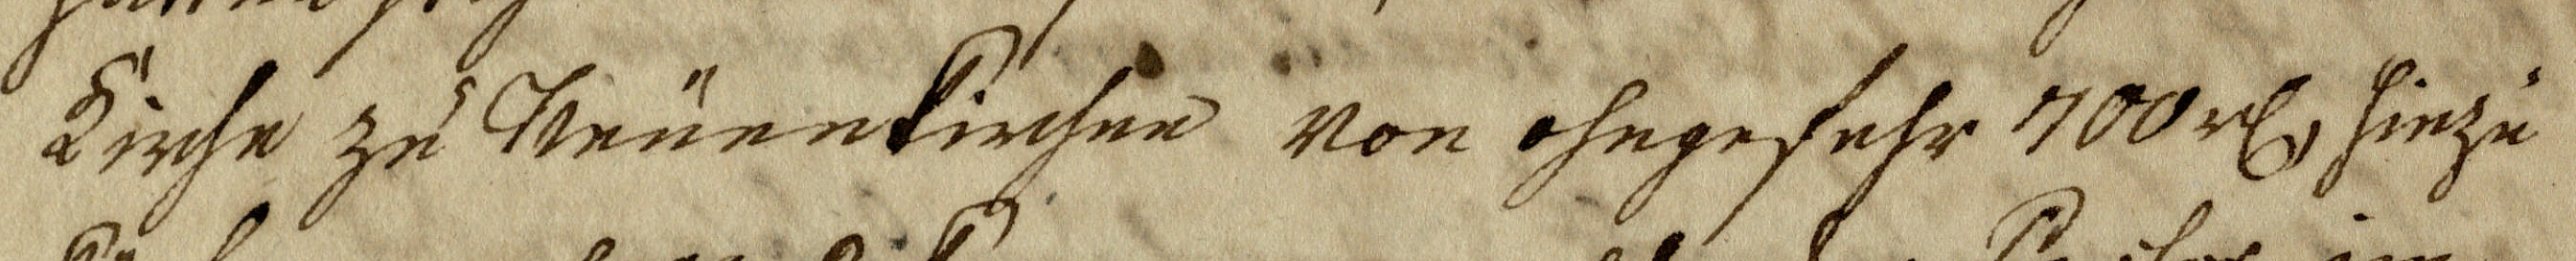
Kirche zu Neuenkirchen von ohngefehr 700 rt, hiezu
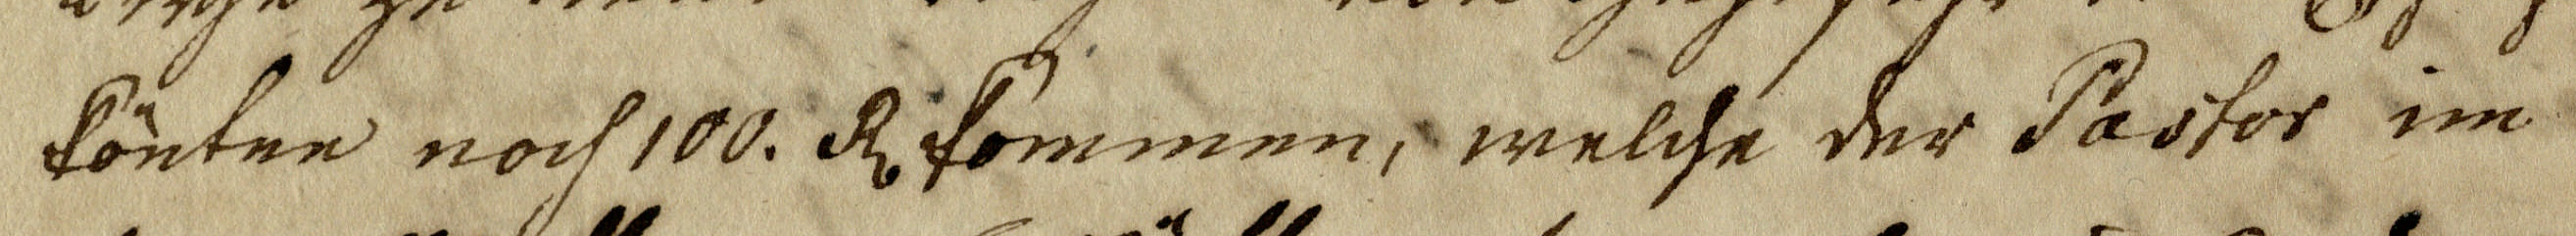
könten noch 100. R. kommen, welche der Pastor im
